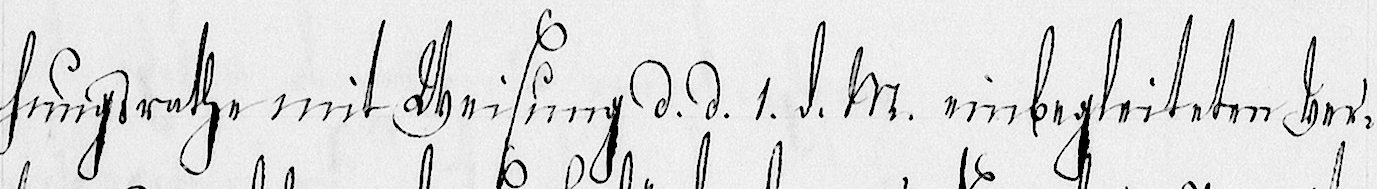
hungsrathe mit Weisung d. d. 1. d. M. einbegleiteten Ve¬
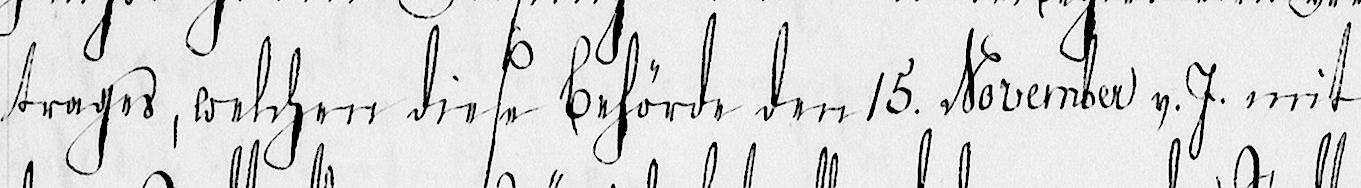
rtrages, welchen diese Behörde den 15. November v. J. mit
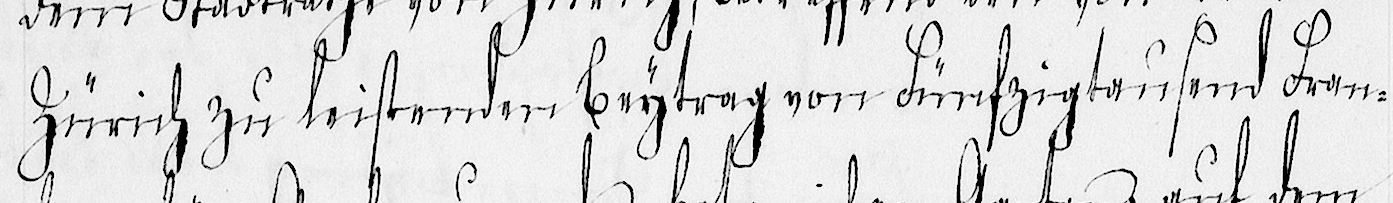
Zürich zu leistenden Beytrag von Fünfzigtausend Fran¬
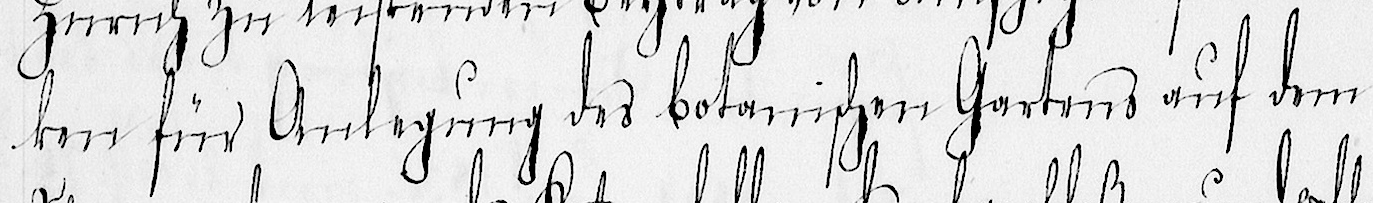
ken für Anlegung des botanischen Gartens auf dem
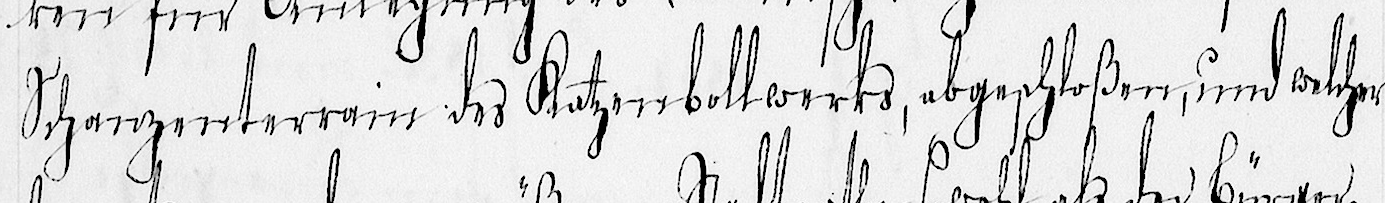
Schanzenterrain des Katzenbollwerks, abgeschloßen, und wel¬
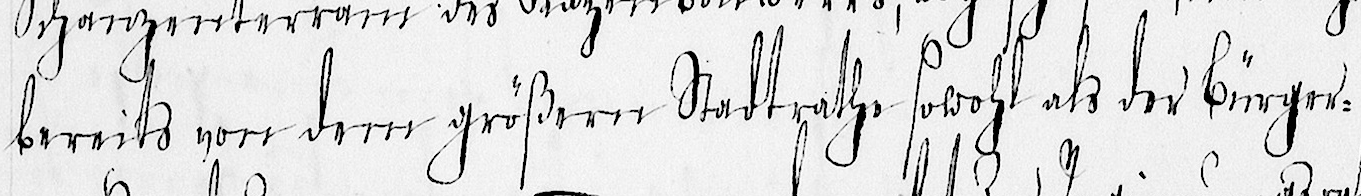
bereits von dem größern Stadtrathe sowohl als der Bürger¬
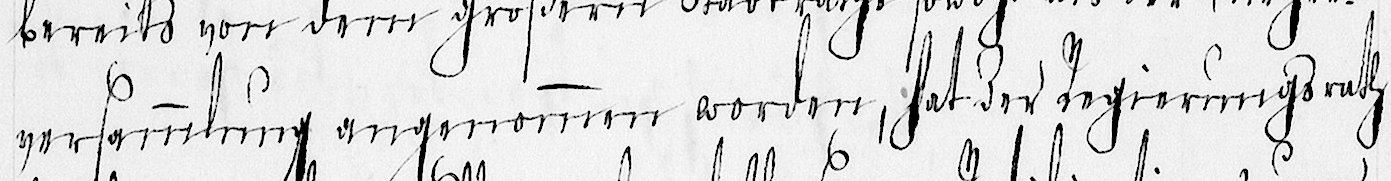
versammlung angenommen worden, hat der Regierungsrath
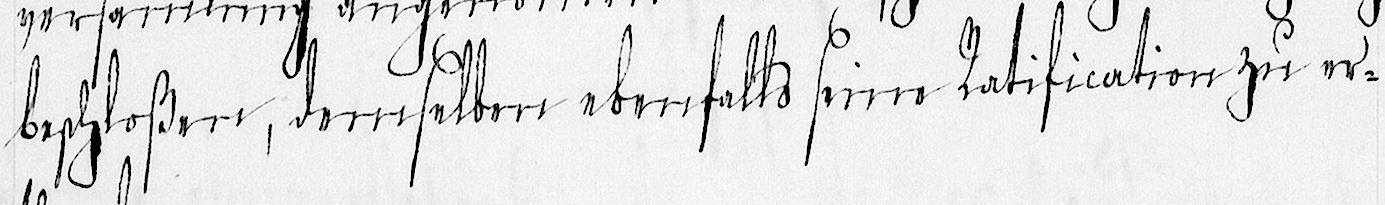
beschloßen, demselben ebenfalls seine Ratification zu er¬
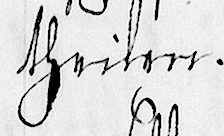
theilen.
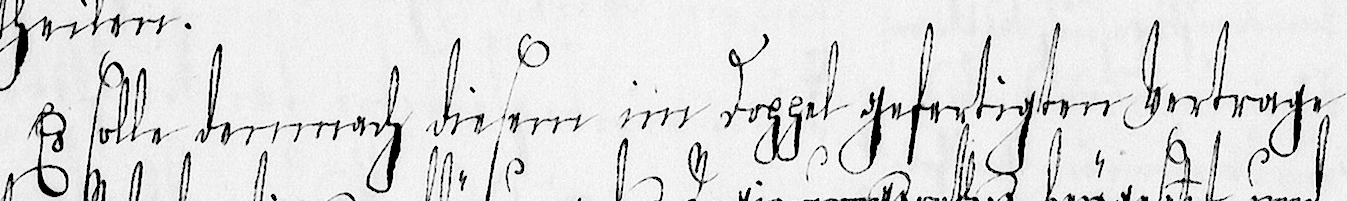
Es solle demnach diesem im Doppel gefertigten Vertrage
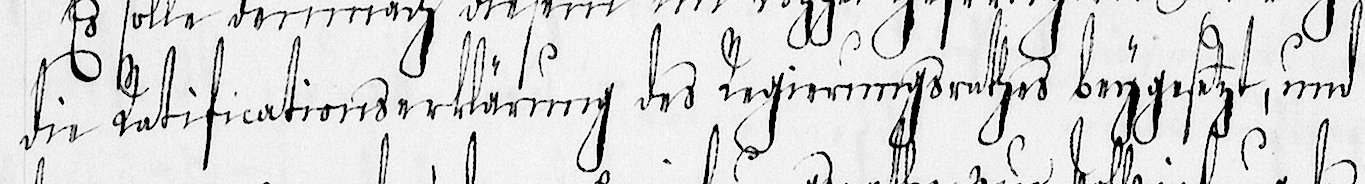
die Ratificationserklärung des Regierungsrathes beygesetzt, und
